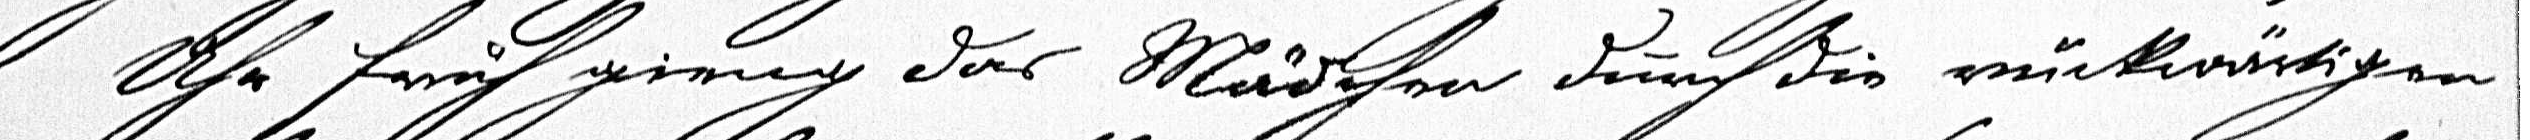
Uhr früh gieng der Mädchen durch die rückwärtigen
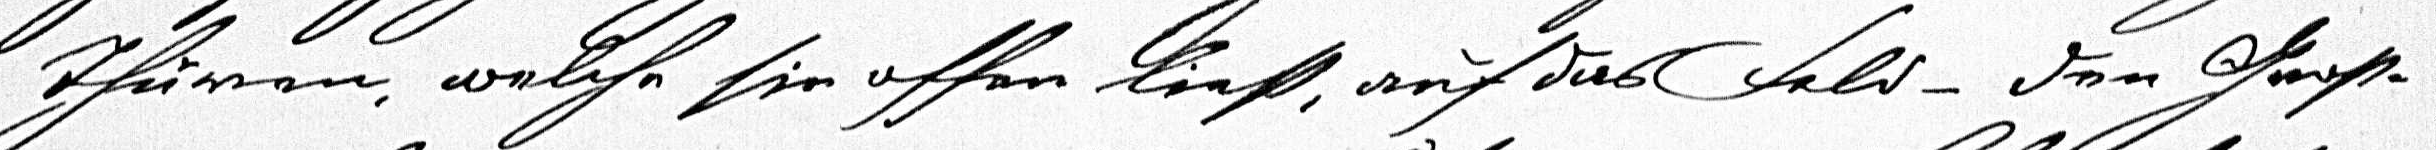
Thüren, welche sie offen ließ auf das Feld- den Groß¬
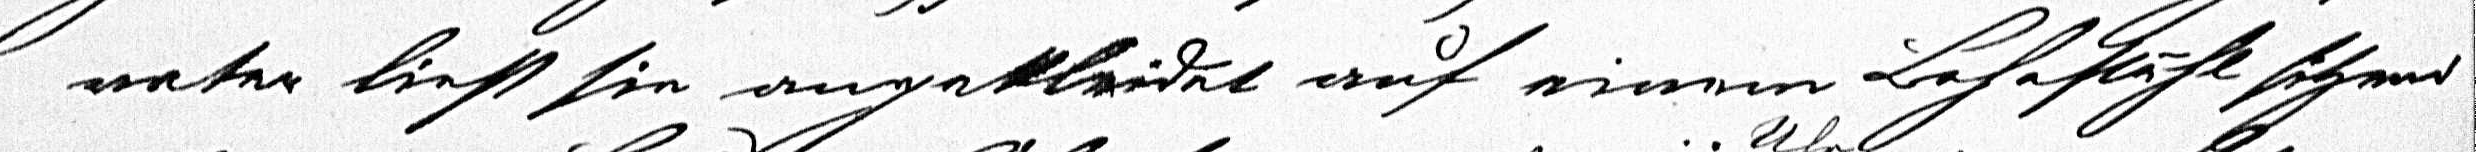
vater ließ sie angekleidet auf einem Lehnstuhl sitzend
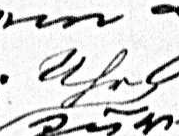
Uhr
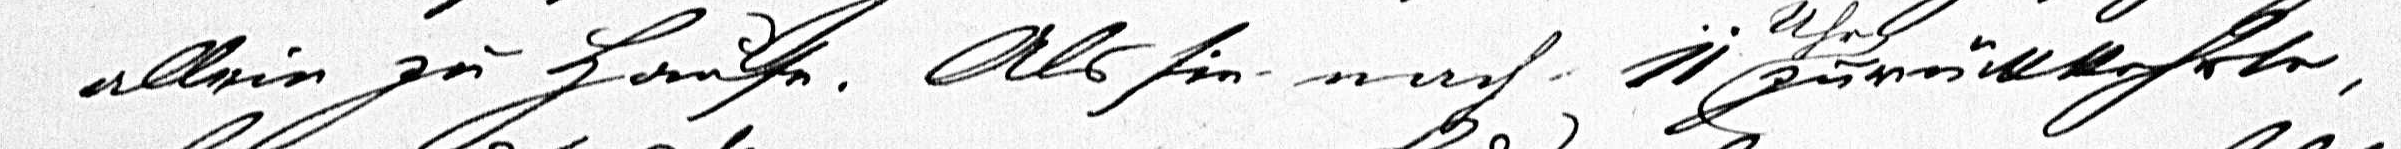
allein zu Hause. Als sie nach 11 zurückkehrte,
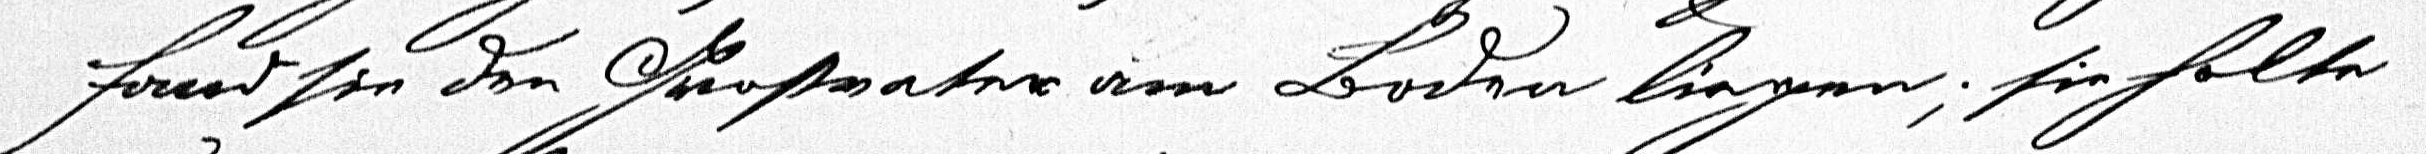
fand sie den Großvater am Boden liegen; sie holte
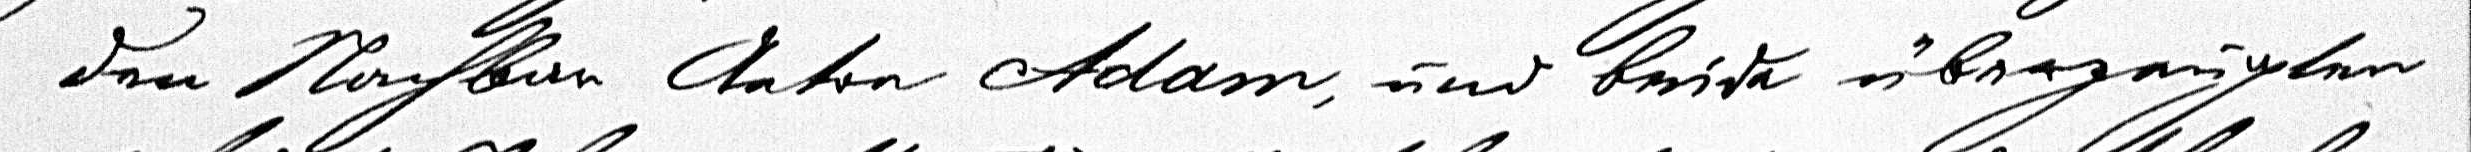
den Nachbar Anton Adam und beide überzeugten
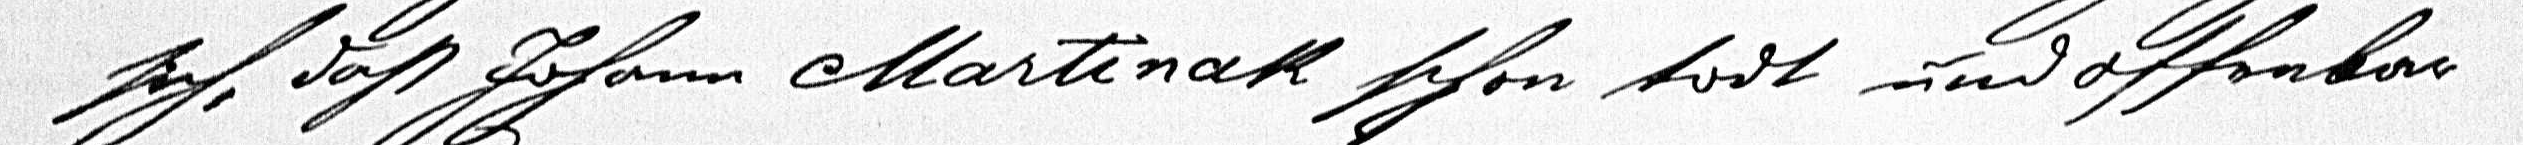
sich, daß Johann Martinak schon todt und offenbar
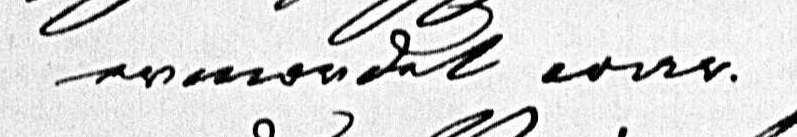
ermordet war.
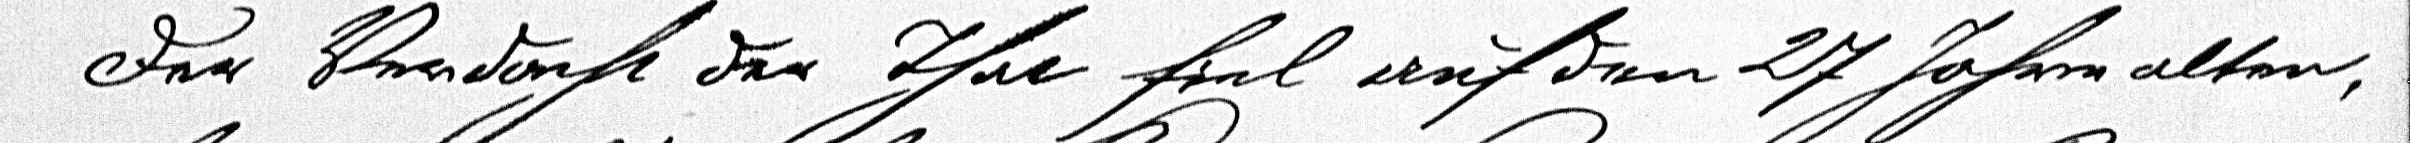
Der Verdacht der That fiel auf den 27 Jahre alten
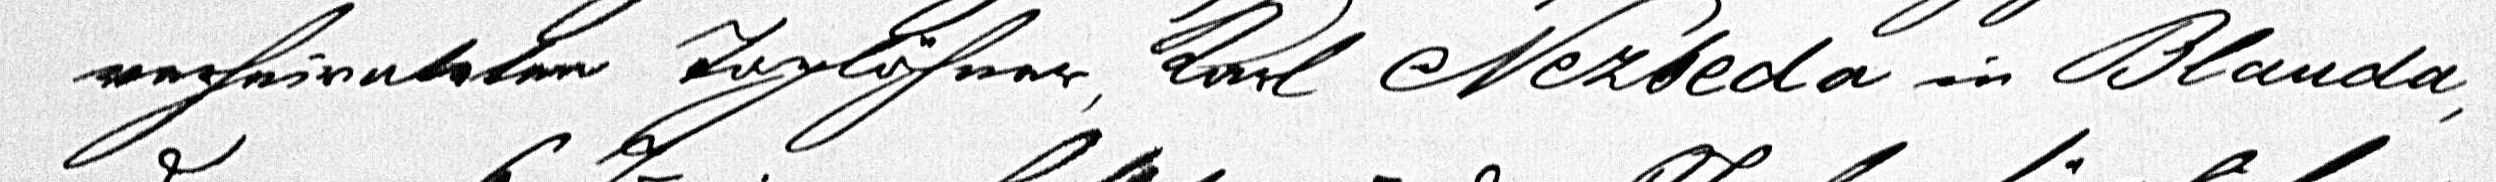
verheirateten Taglöhner, Karl Nezbeda in Blauda,
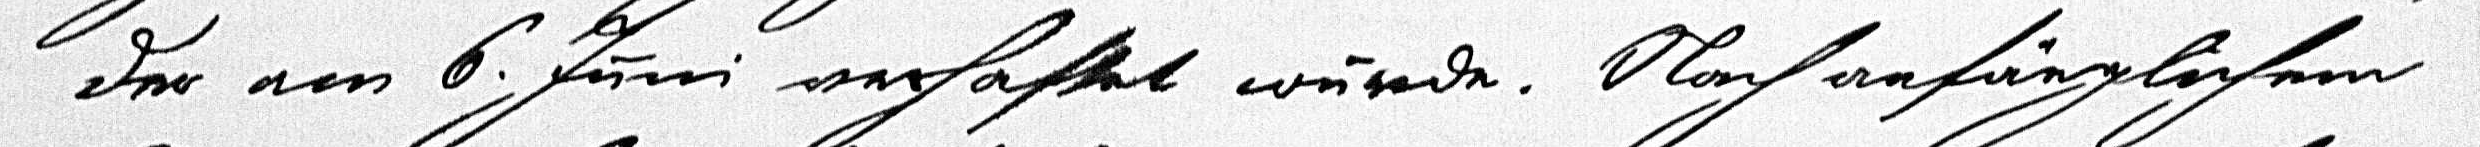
der am 6. Juni verhaftet wurde. Nach anfänglichem
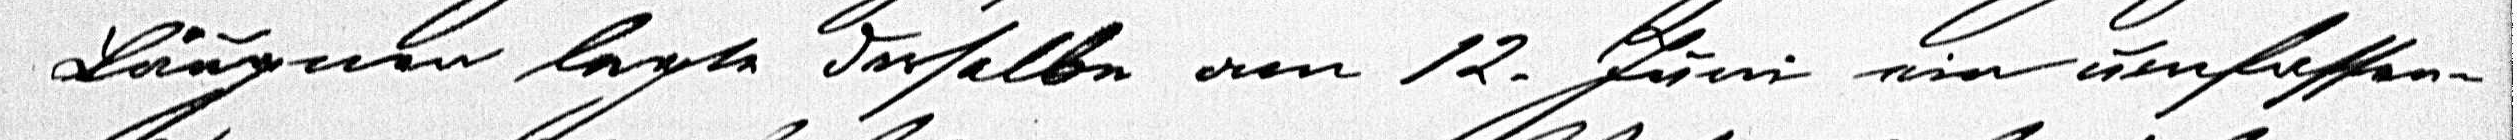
Läugnen legte derselbe am 12. Juni ein umfassen¬
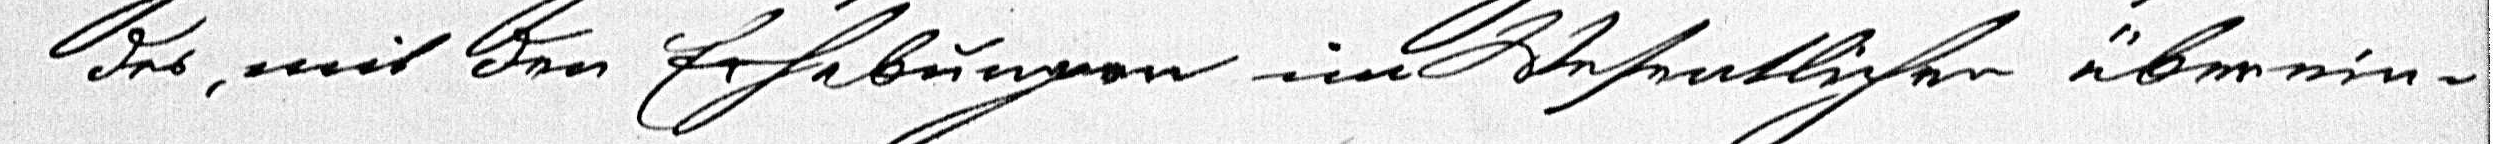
des, mit den Erhebungen im Wesentlichen über ein¬
